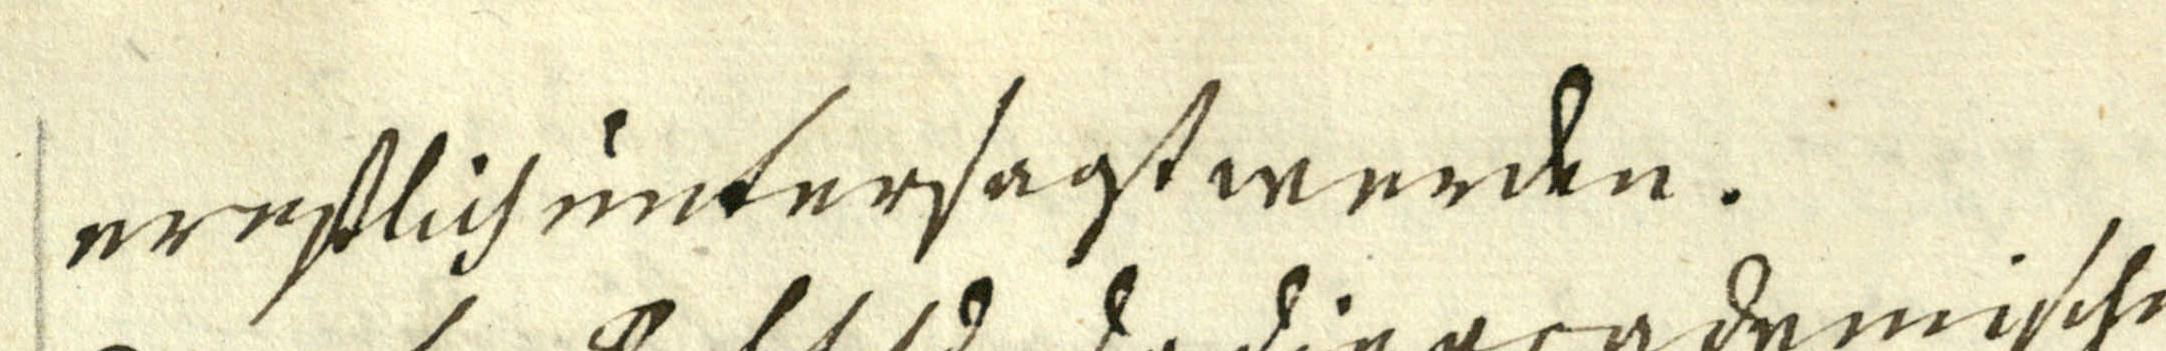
ernstlich untersagt werden.
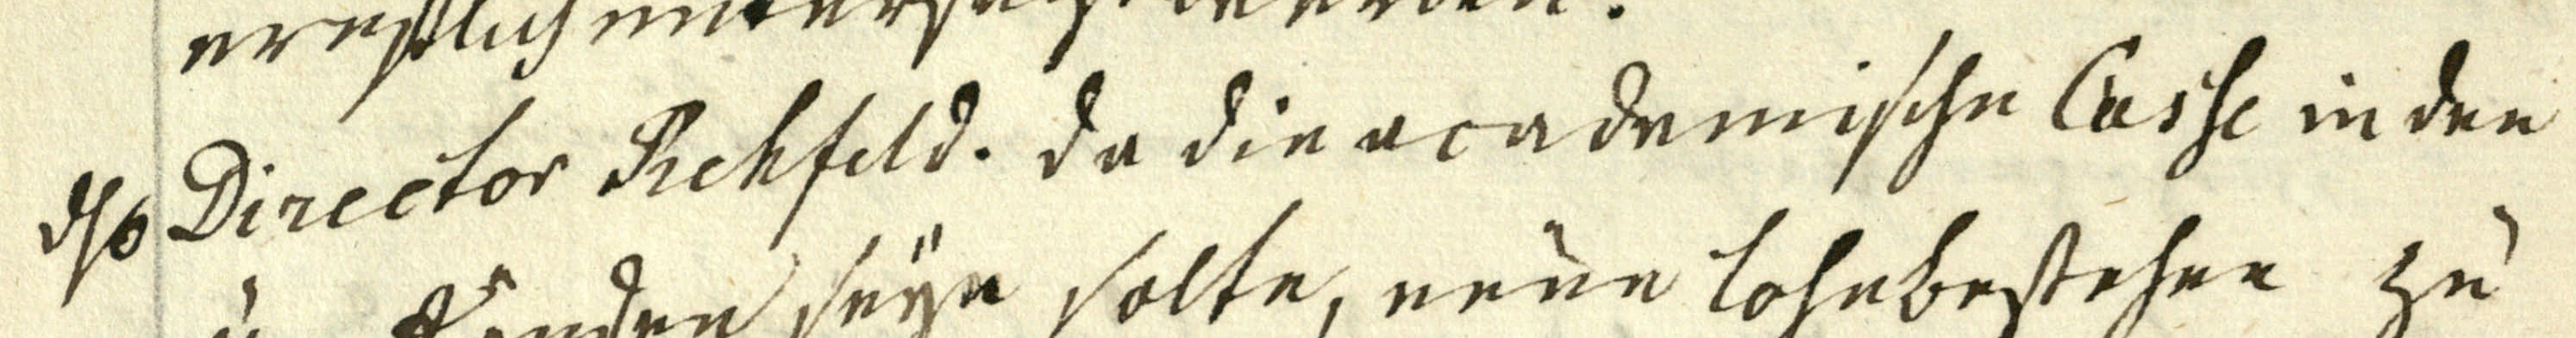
dh Director Rehfeld. Da die academische Casse in den
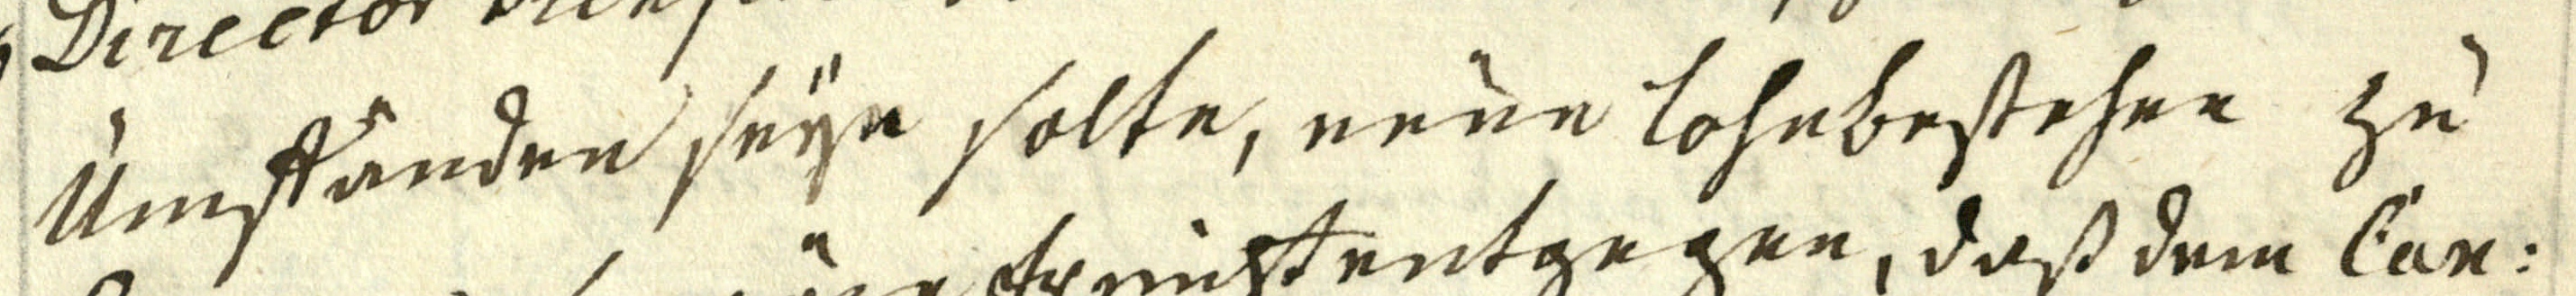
Umständen seÿn solte, neue Lohnbestehen zu
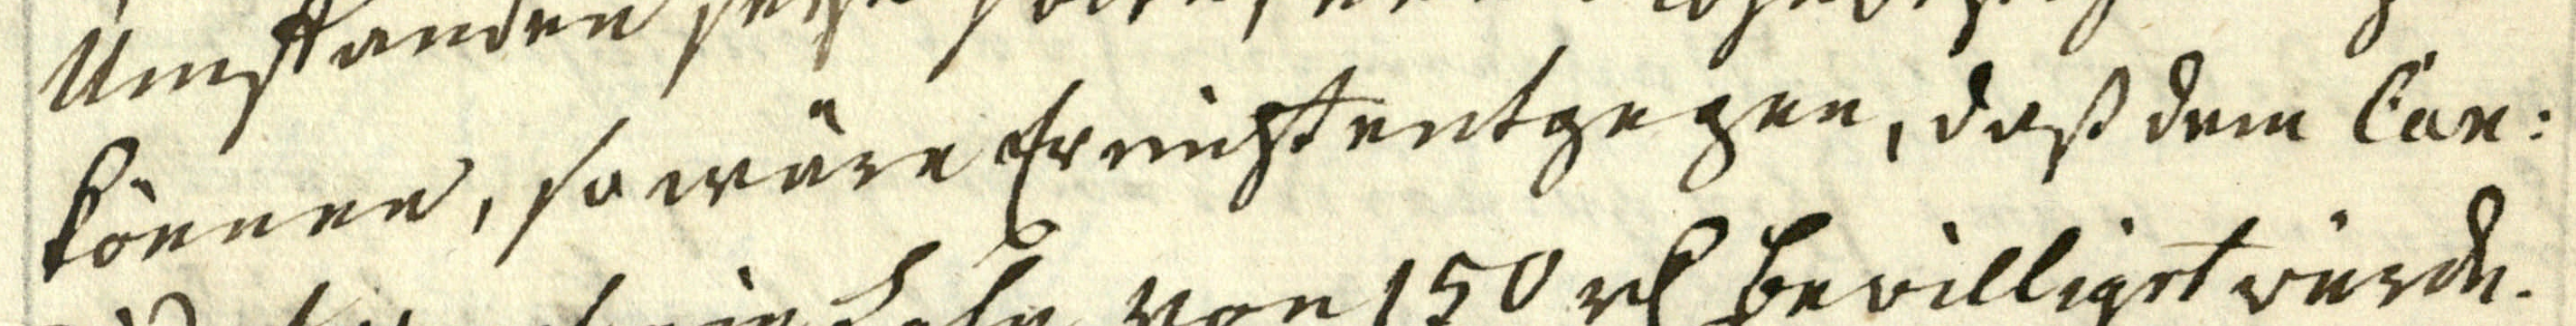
können, so wäre Er nicht entgegen, daß dem Can¬
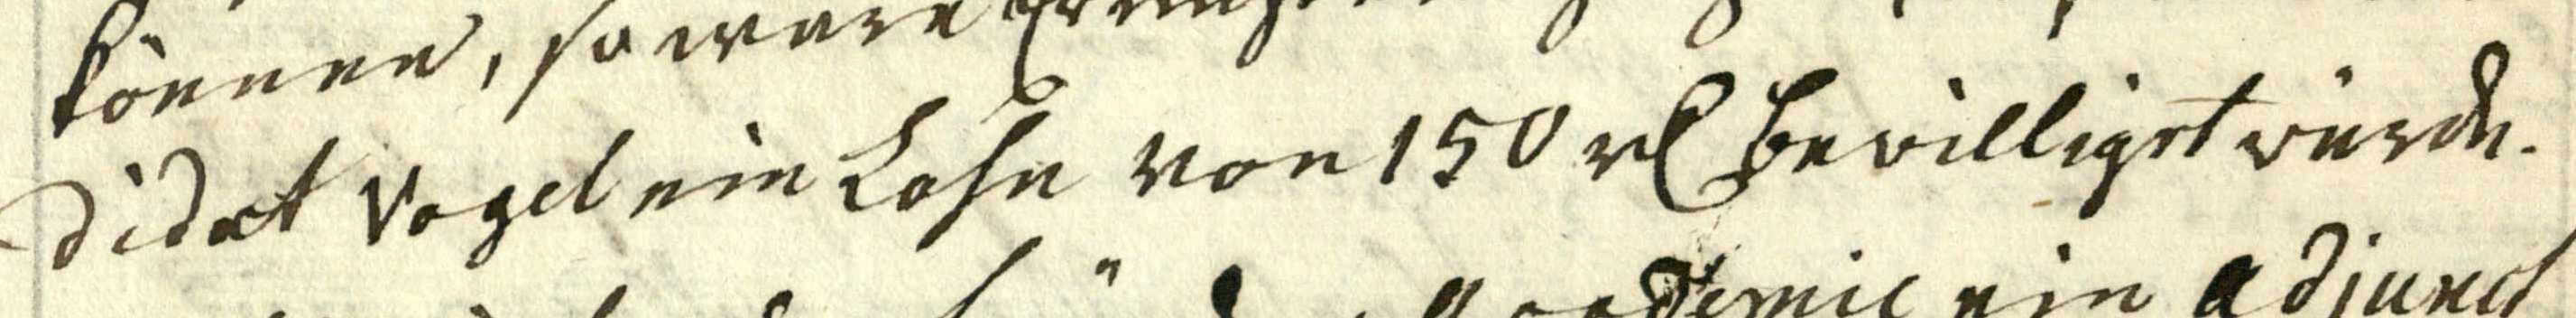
didat Vogel ein Lohn von 150 r. bewilliget würde.
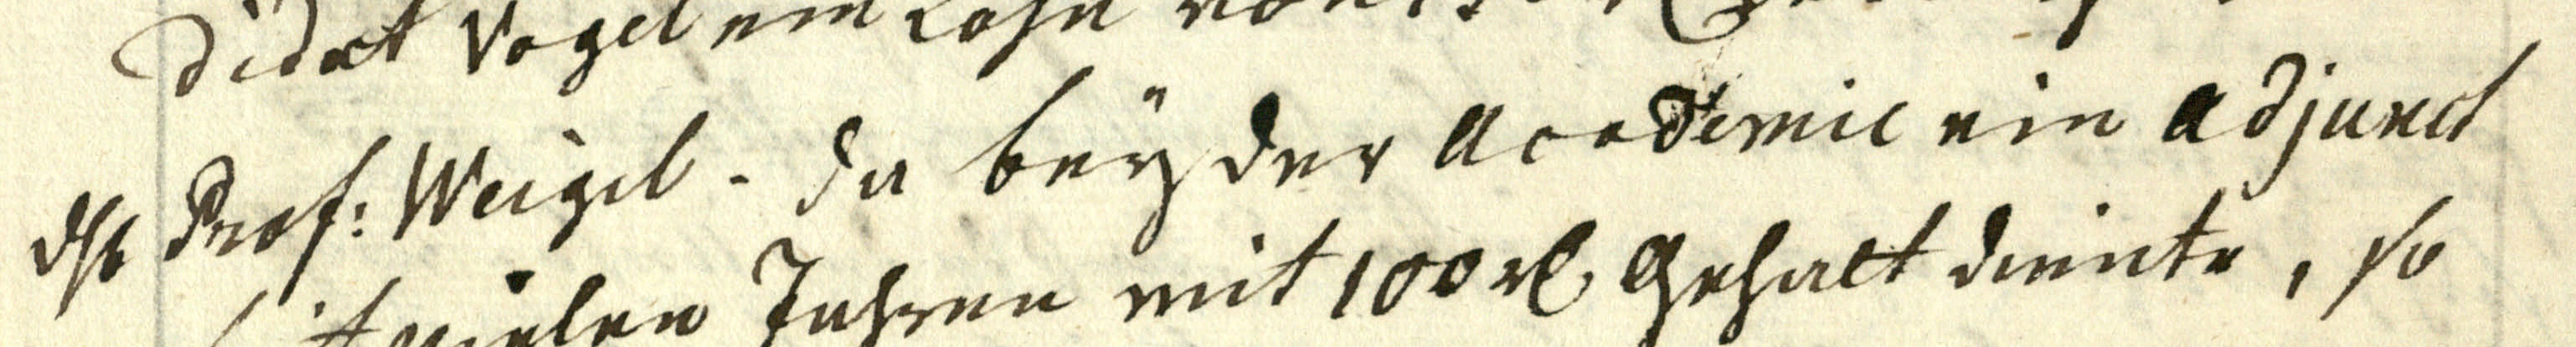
dh Prof. Weigel Da beÿ der Academie ein Adjunct
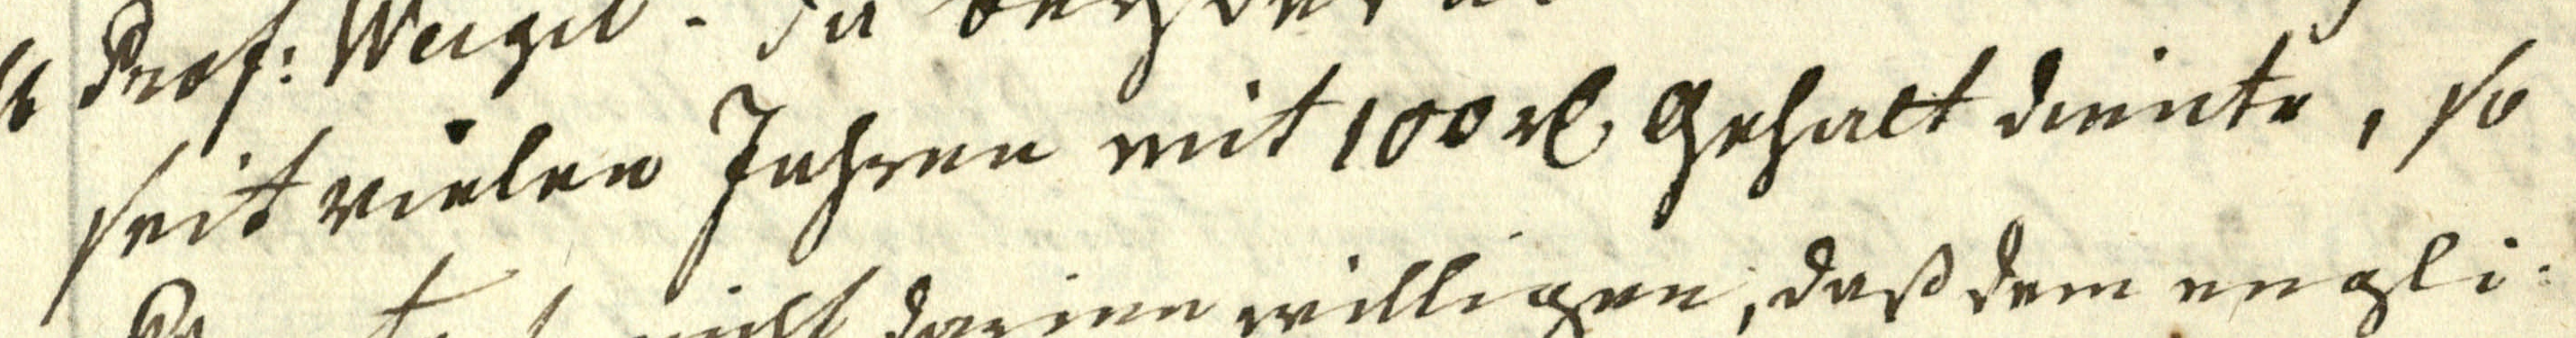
seit vielen Jahren mit 100 r. Gehalt diente, so
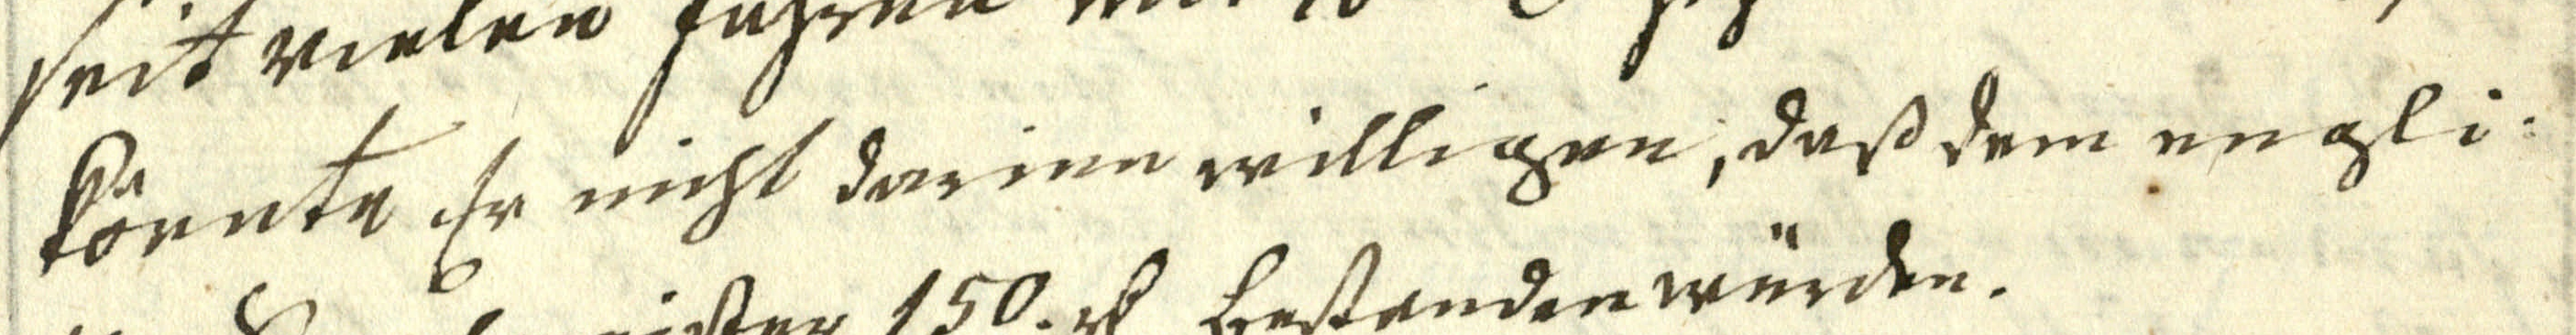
könnte Er nicht darin willigen, daß dem engli¬
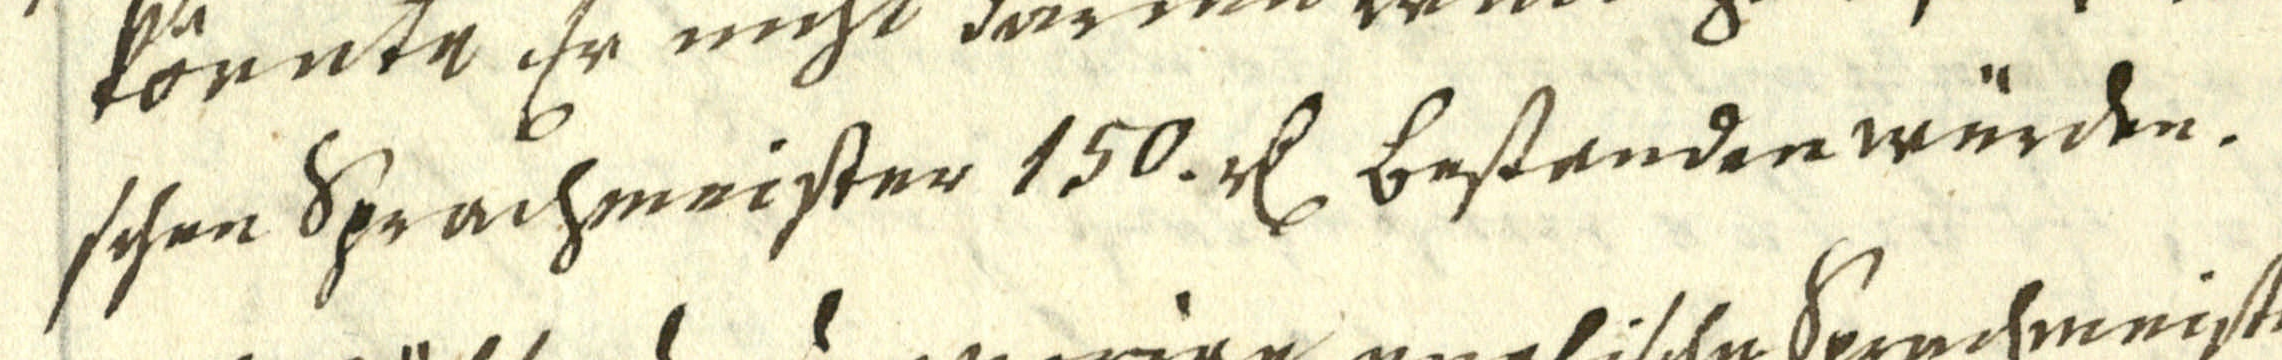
schen Sprachmeister 150. r. bestanden würden.
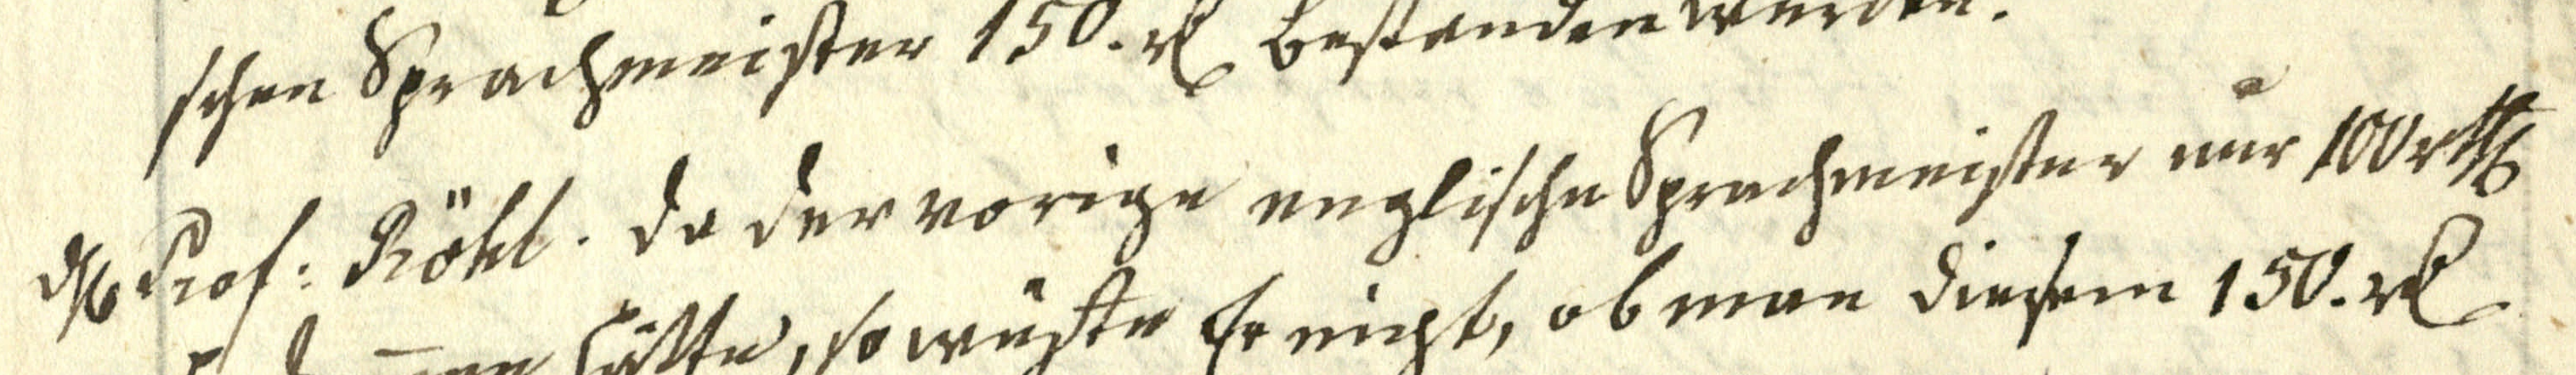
dh Prof. Röhl. Da der vorige englische Sprachmeister nur 100 rth.
